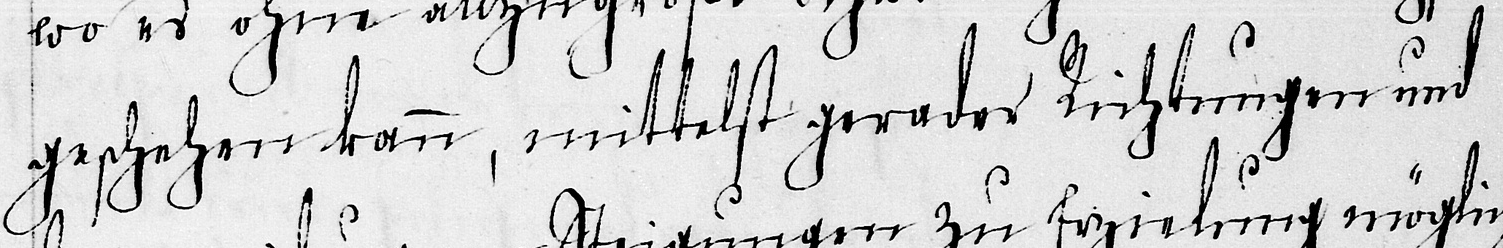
geschehen kann, mittelst gerader Richtungen und
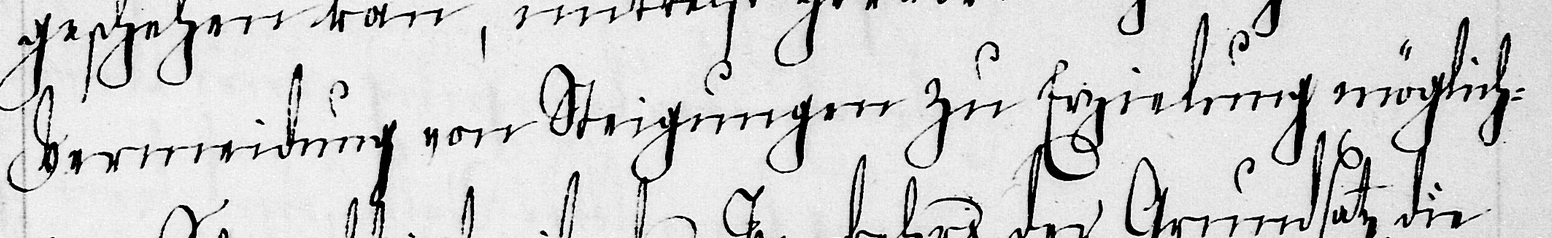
Vermeidung von Steigungen zu Erzielung möglich¬
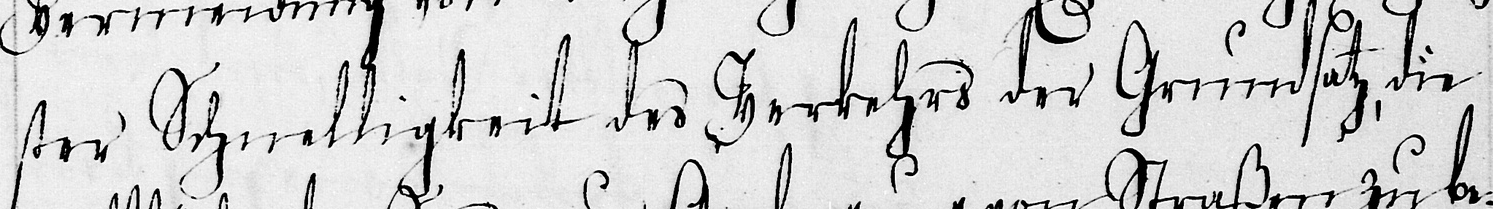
ster Schnelligkeit des Verkehrs der Grundsatz, die
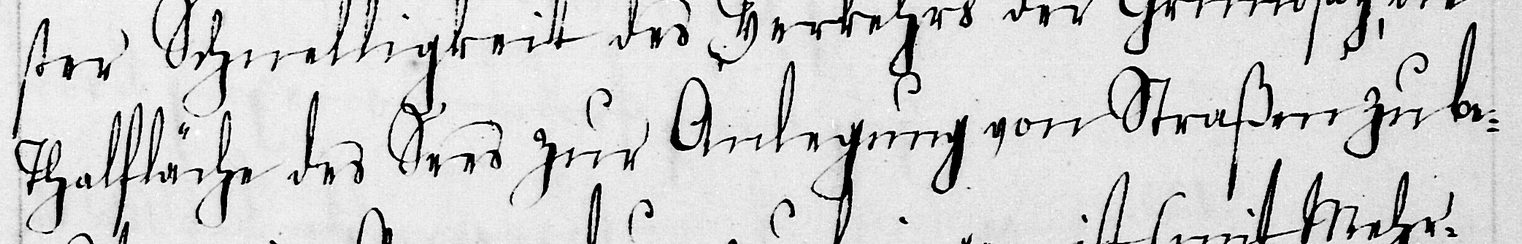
Thalfläche des Sees zur Anlegung von Straßen zu be¬
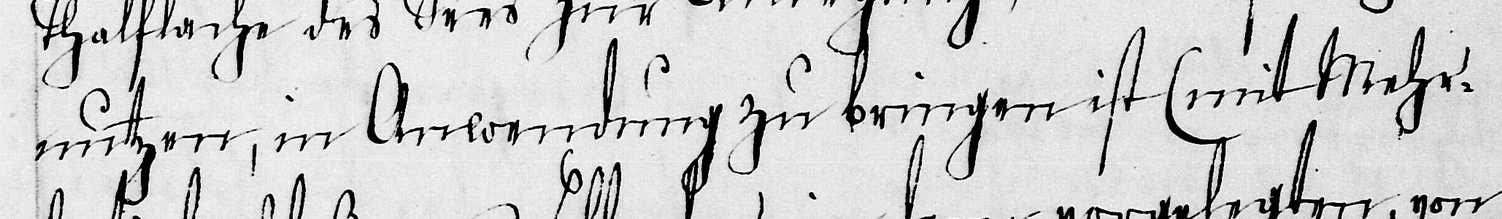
nutzen, in Anwendung zu bringen ist (mit Mehr¬
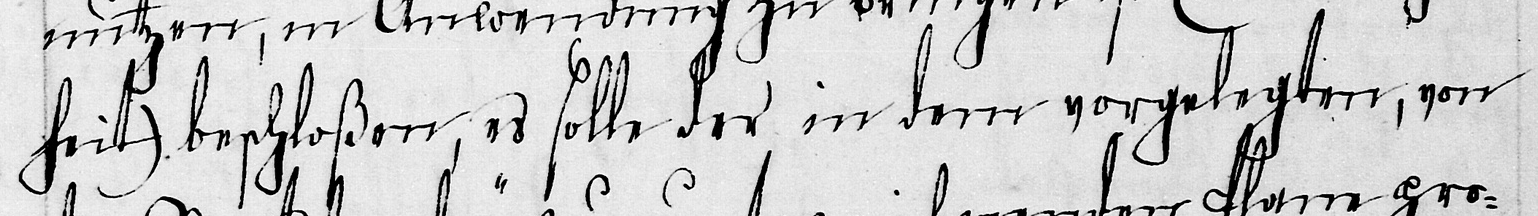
heit) beschloßen, es solle der in dem vorgelegten, von
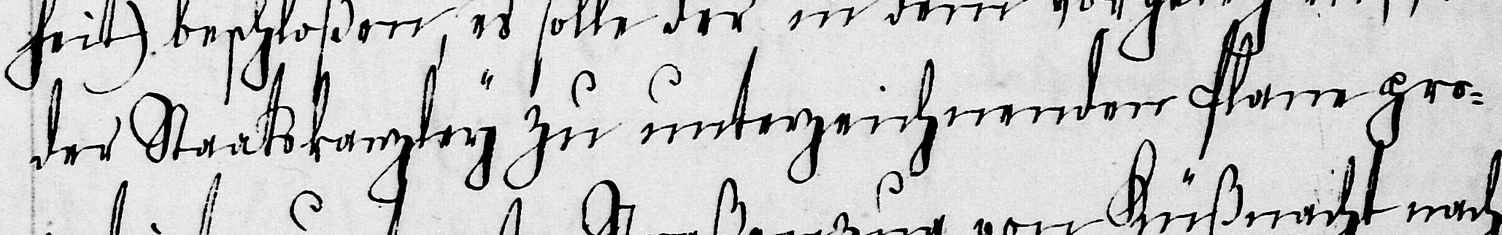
der Staatskanzley zu unterzeichnenden Plane pro¬
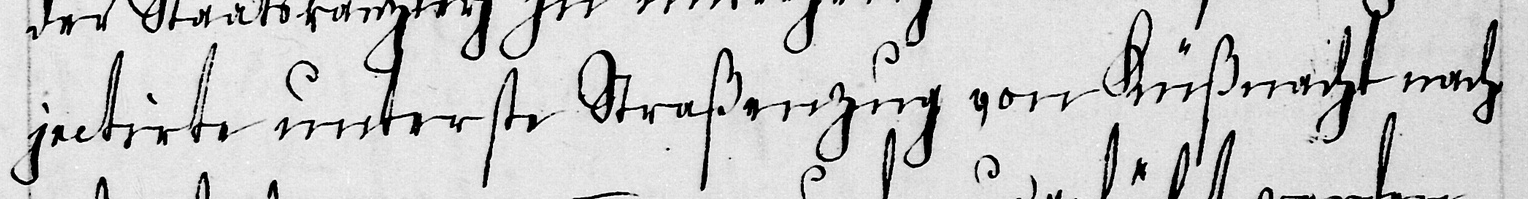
jectirte unterste Straßenzug von Küßnacht nach
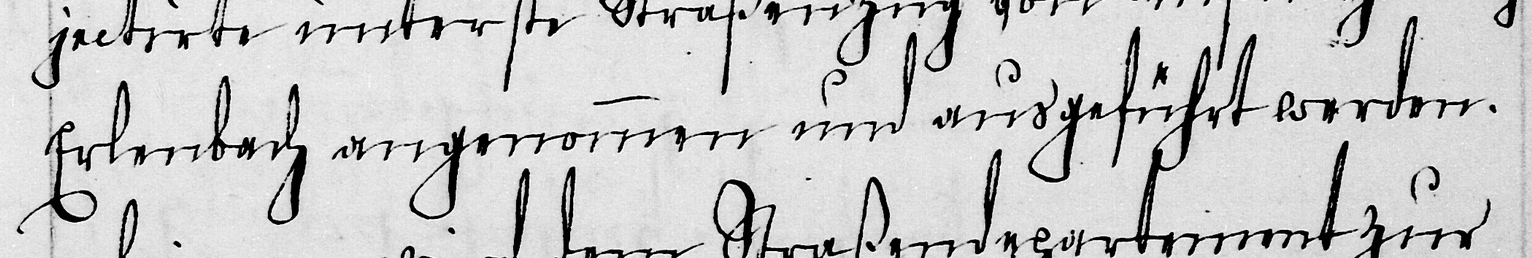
Erlenbach angenommen und ausgeführt werden.
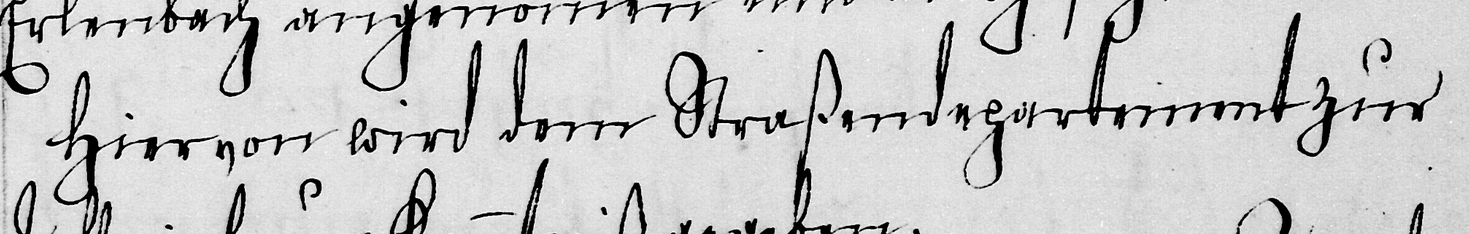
Hiervon wird dem Straßendepartement zur
